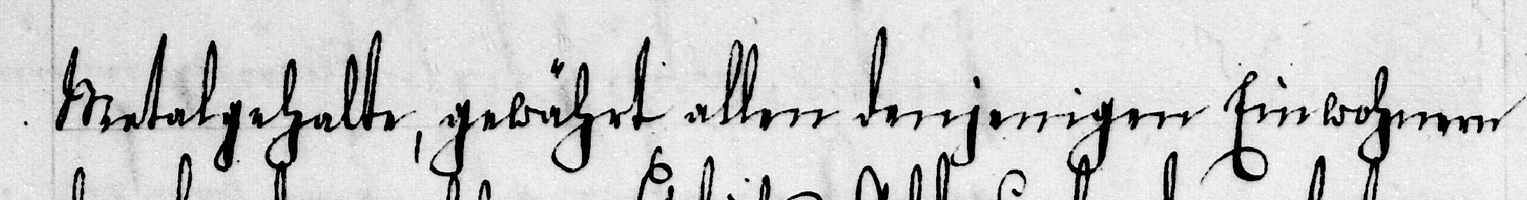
Metalgehalte, gewährt allen denjenigen Einwohnern
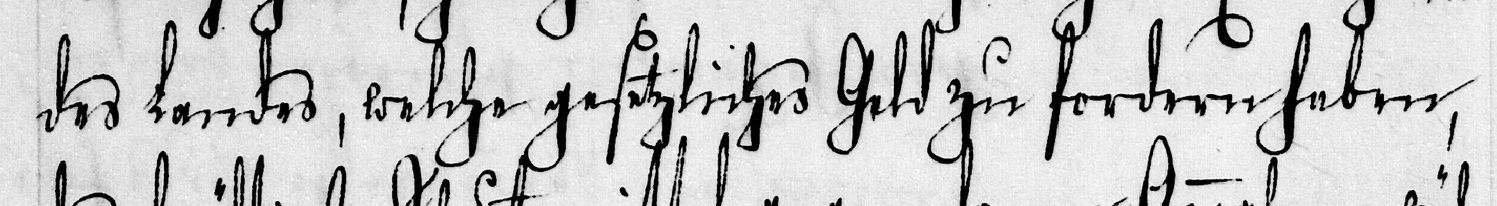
des Landes, welche gesetzliches Geld zu fordern
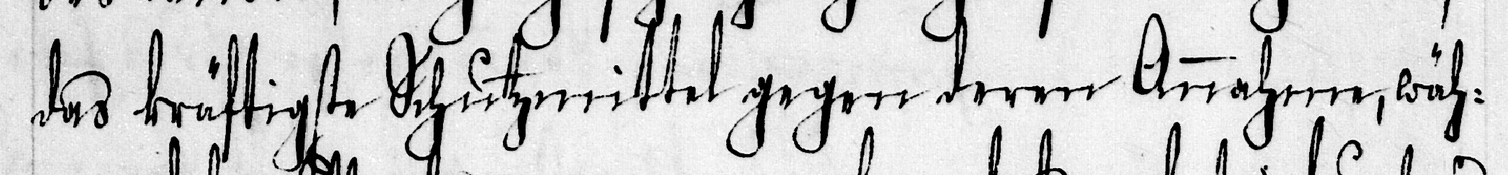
das kräftigste Schutzmittel gegen deren Annahme, wäh¬
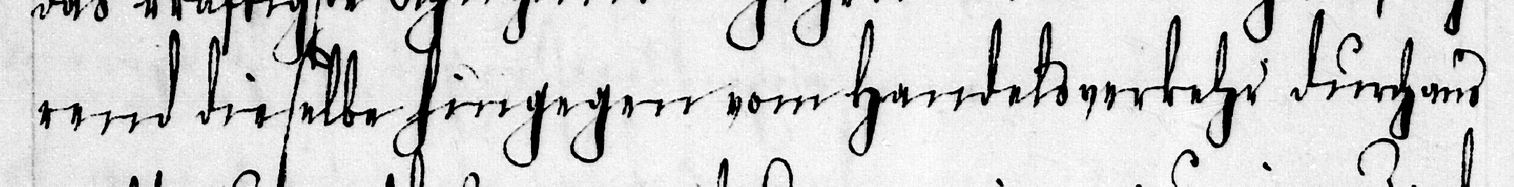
rend dieselbe hingegen vom Handelsverkehr durchaus
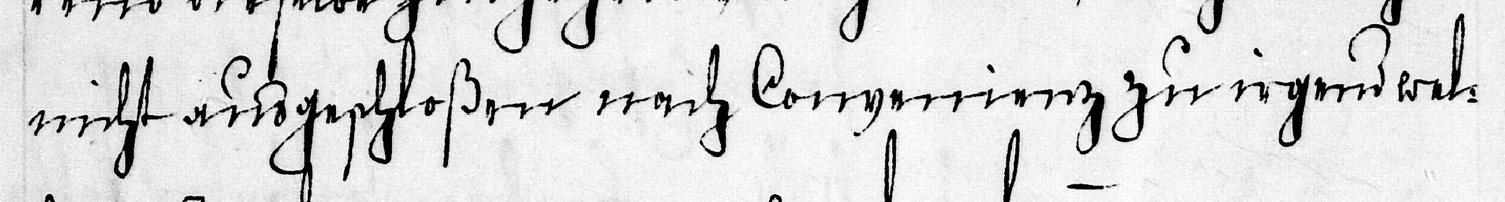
nicht ausgeschloßen nach Convenienz zu irgend wel¬
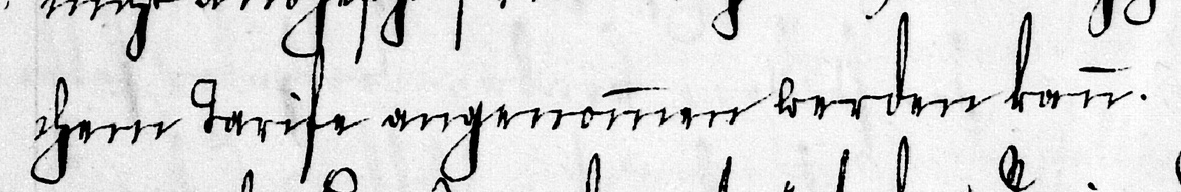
chem Tarife angenommen werden kann.
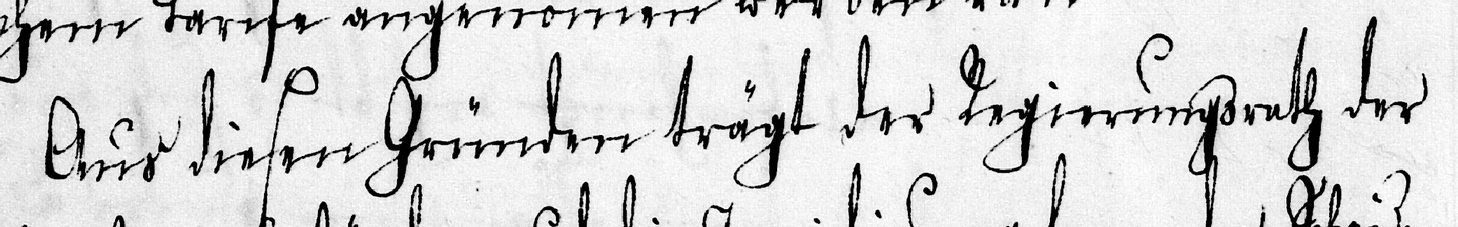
Aus diesen Gründen trägt der Regierungsrath der
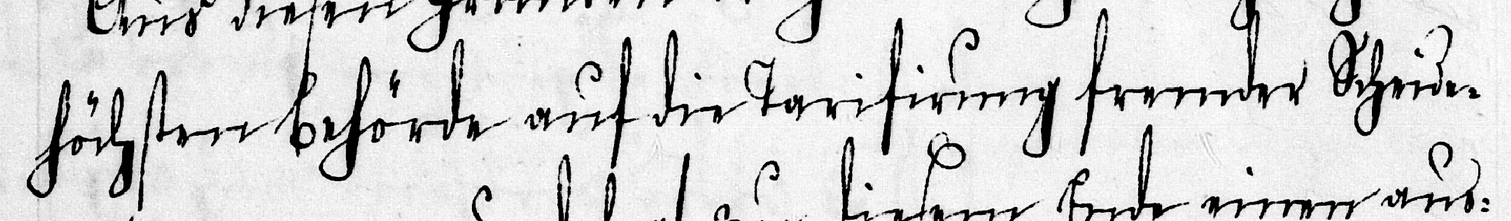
höchsten Behörde auf die Tarifirung fremder Scheide¬
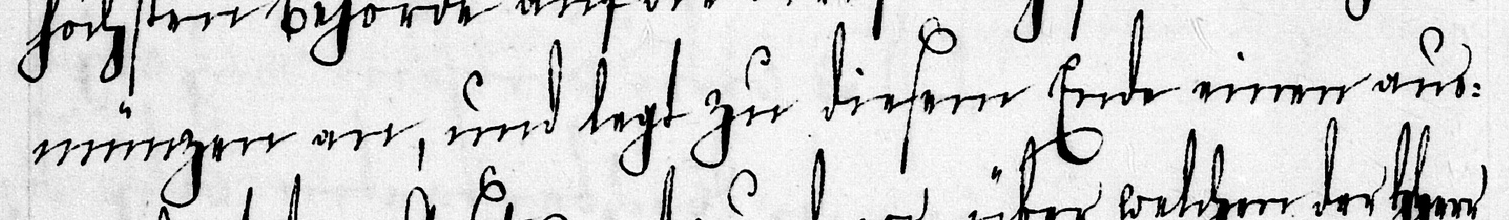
münzen an, und legt zu diesem Ende einen aus¬
